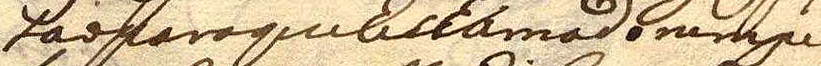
ta o para que he chamado nem pe
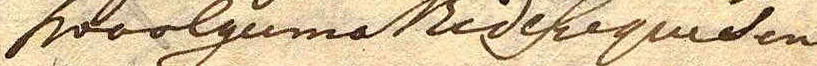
ssoa alguma lhe disse que sen
